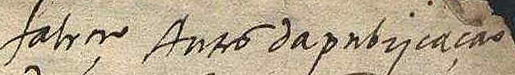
faleçeo Antes da prubrjcacao
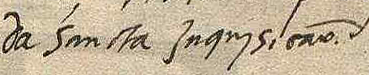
da Sancta Jnqujsicão
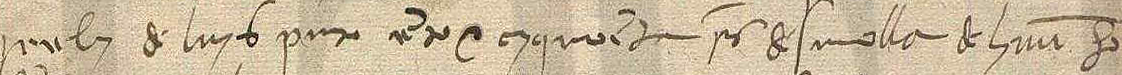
reçeby de lujs pinto cēto e cyquoēta r̄s desmolla de huū ho
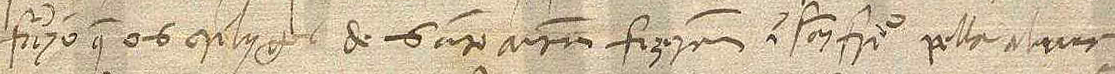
ficyo q̄ os crelygos de sāto antā dizeram ē san frco pella alma
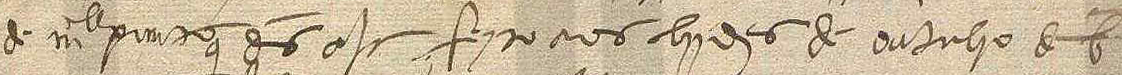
de mell pimto q̄ ds̄ aJa fejto aos bj djas de outubro de b
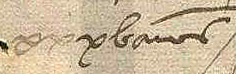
xxx b an̄os /
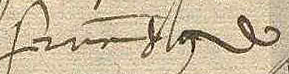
fernā delgado
